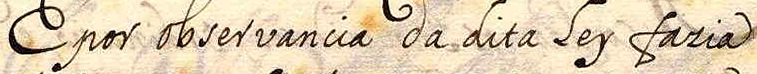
E por observancia da dita Ley fazia
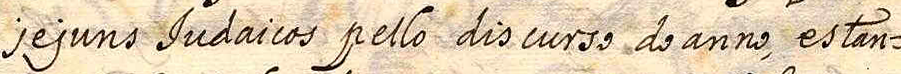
jejuns Iudaicos pello discurso do anno, estan
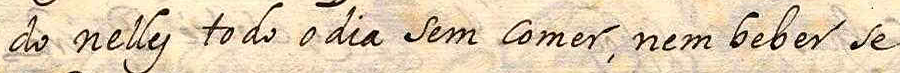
do nelles todo o dia sem comer, nem beber se
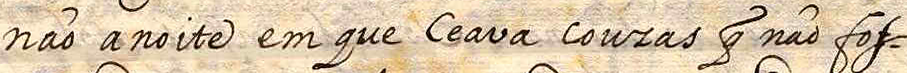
não a noite em que ceava couzas q̄ não fos
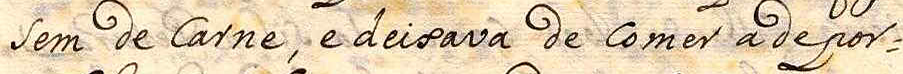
sem de carne, e deixava de comer a de por
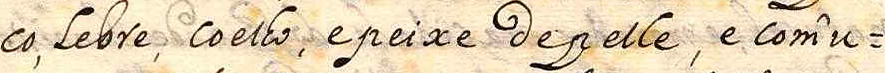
co, Lebre, coelho, e peixe de pelle, e com̄u
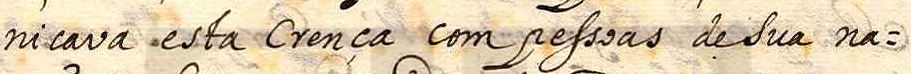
nicava esta crença com pessoas de sua na
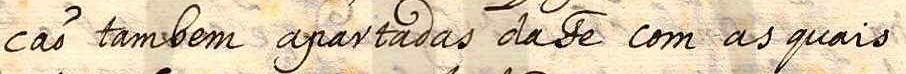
çaõ tambem apartadas da Fe com as quais
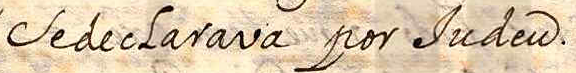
Se declarava por Iudeu.
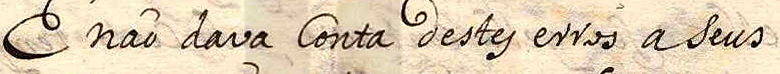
E não dava conta destes erros a seus
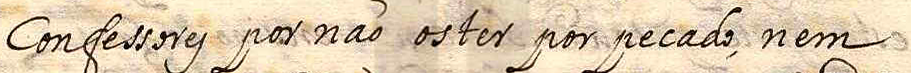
Confessores por naõ os ter por pecado, nem
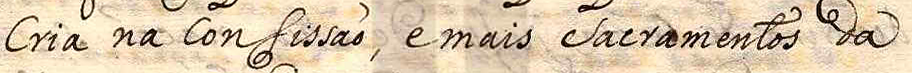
Cria na confissaõ, e mais Sacramentos da
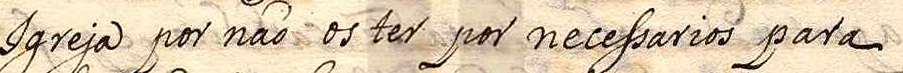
Igreja por não os ter por necessarios para
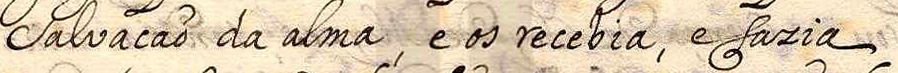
Salvação da alma, e os recebia, e fazia
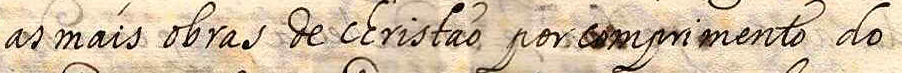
as mais obras de christaõ por comprimento do
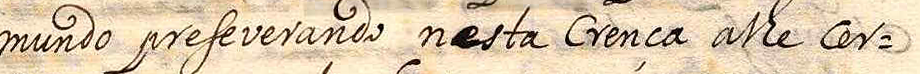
mundo preseverando nesta crença athe cer
